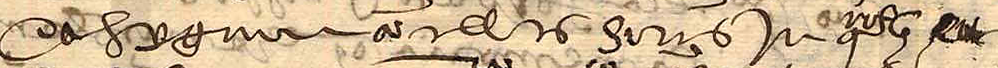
e asygnou cō elles sores̄ Jnqros E eu
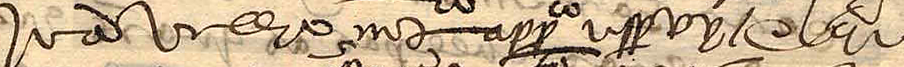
Joāo Velho notro appco o sꝑvy / e Eu
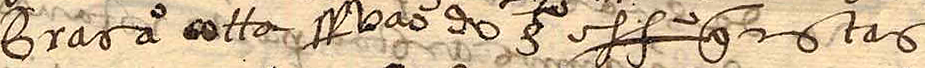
Bras ao cotta sꝑvaõ do sto offo q̄ estas
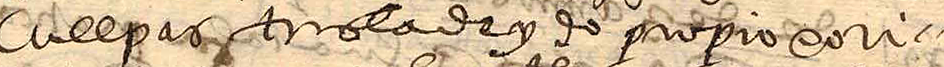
cullpas tresladey do propio e ori //
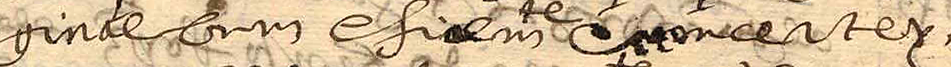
ginal bem e fielmte e conçertey
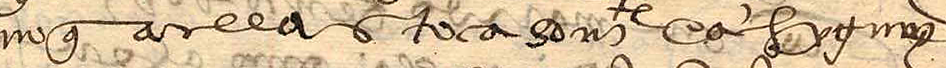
no q̄ a ellas toca somte e asygney
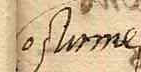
Costume
